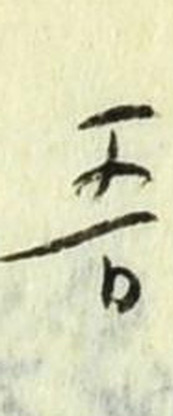廿一日
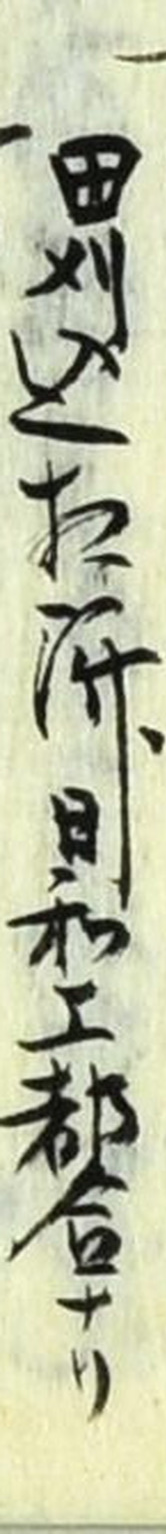田刈込相済日和上都合ナリ
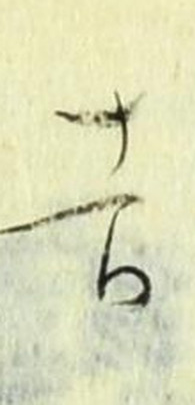廿一日
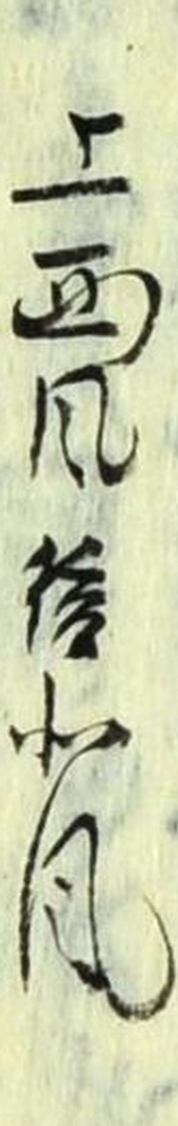上西風後北風
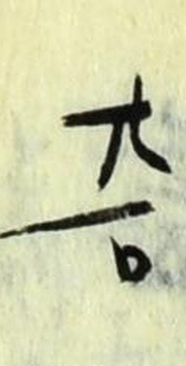廿一日
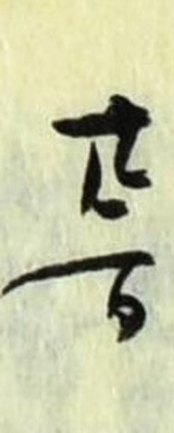廿一日
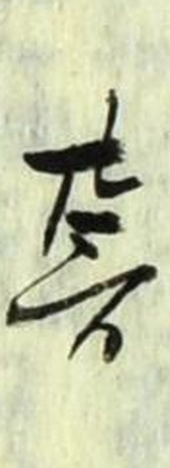廿一日
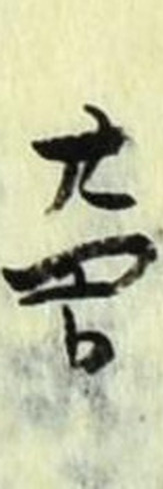廿一日
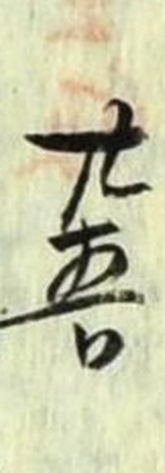廿一日
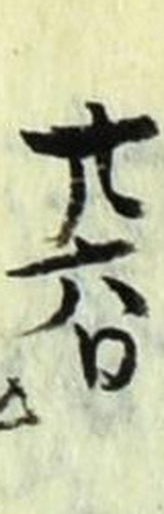廿一日
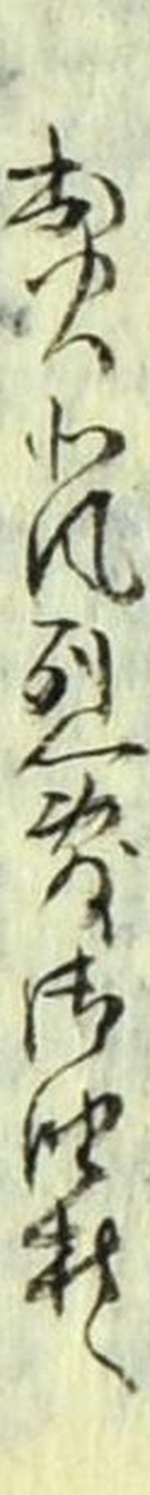△出火北風烈敷御油村へ
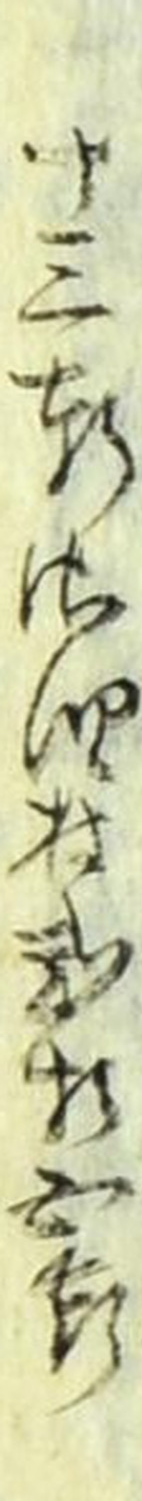十三軒御油村弐拾五軒
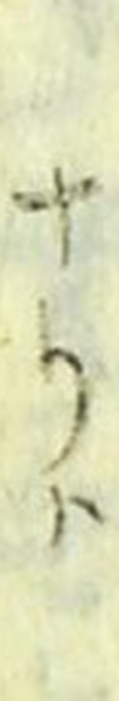ナリト

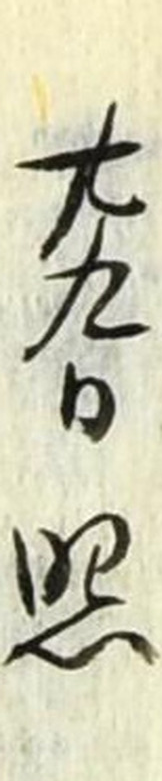廿九日照
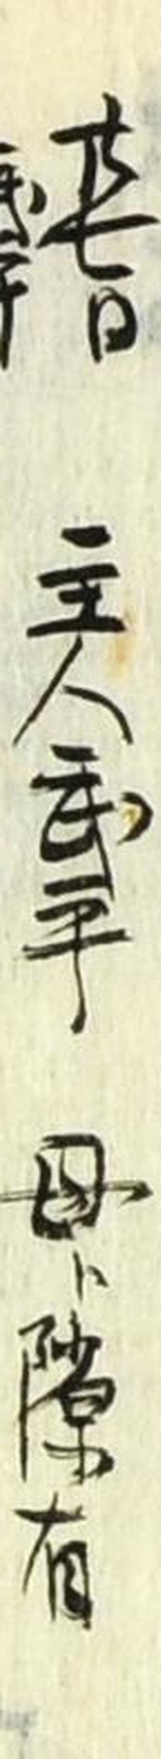廿七日主人武平母と隙有
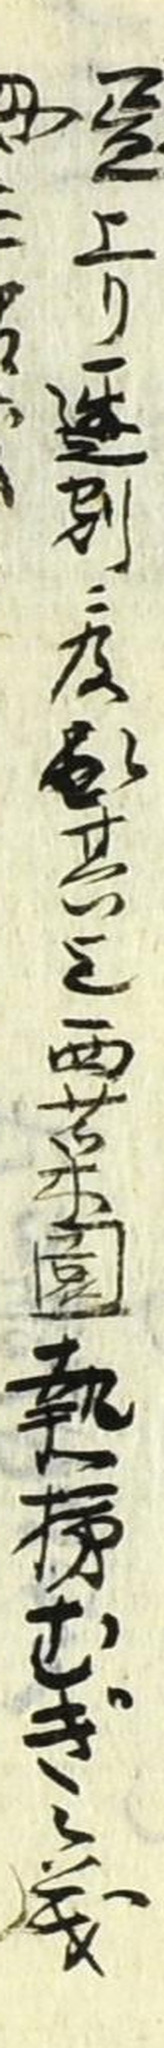昼上り遅刻ニ及候其上西菜園熟柿むぎ候義
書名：（日記）
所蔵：福井県文書館 Fukui Prefectural Archives
